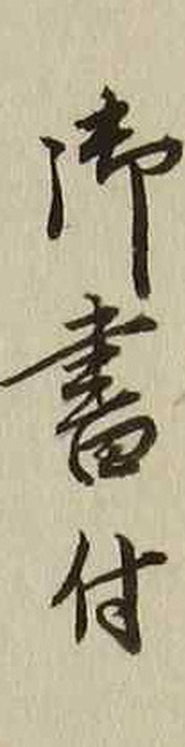御書付
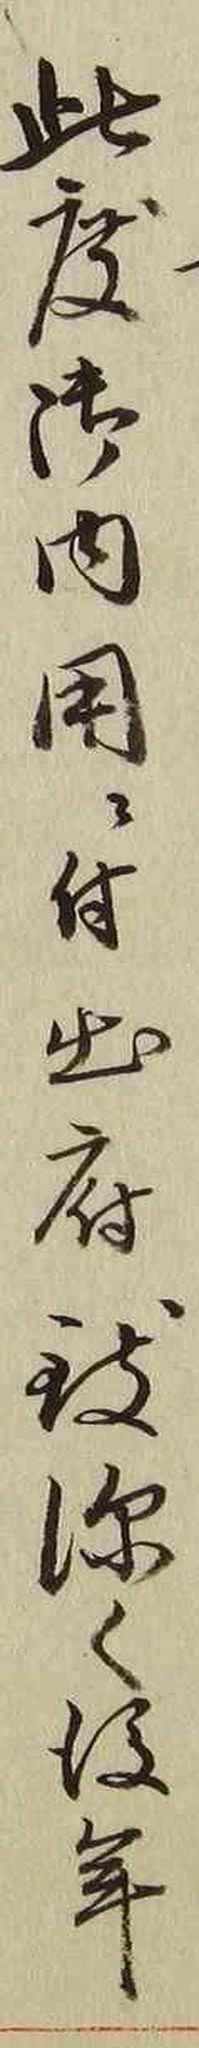此度御内用に付出府致深く後年
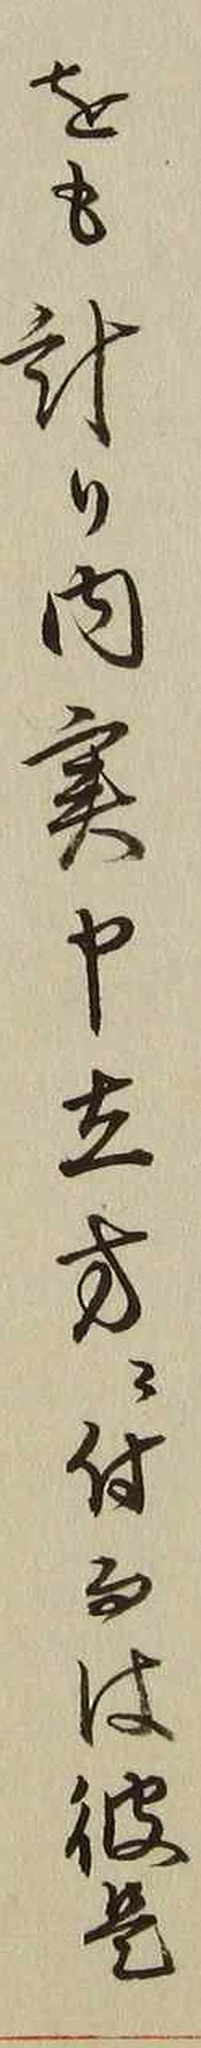をも計り内実申立方に付而は彼是
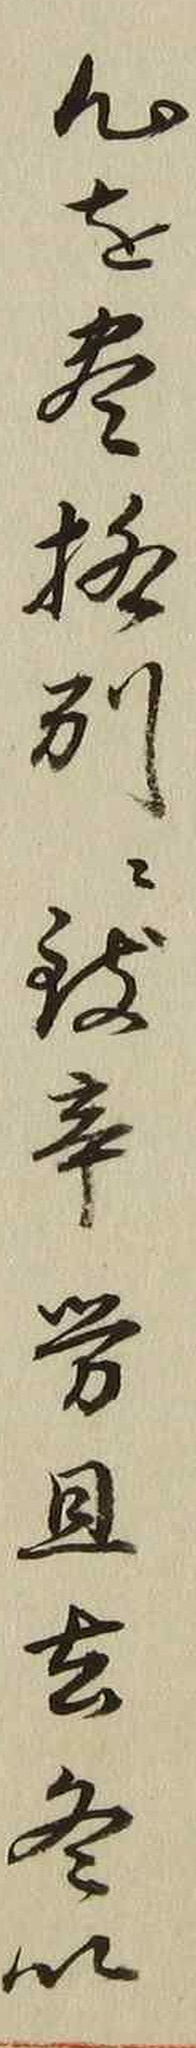心を尽格別に致辛労且去冬以
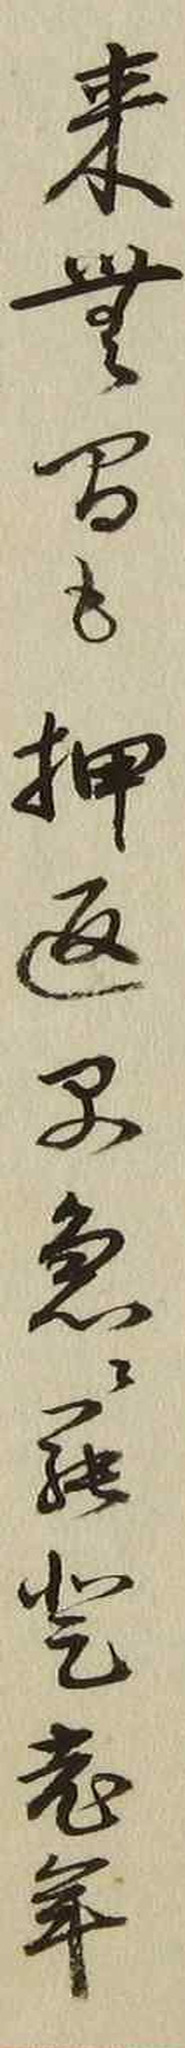来世間も押返早急に罷登老年
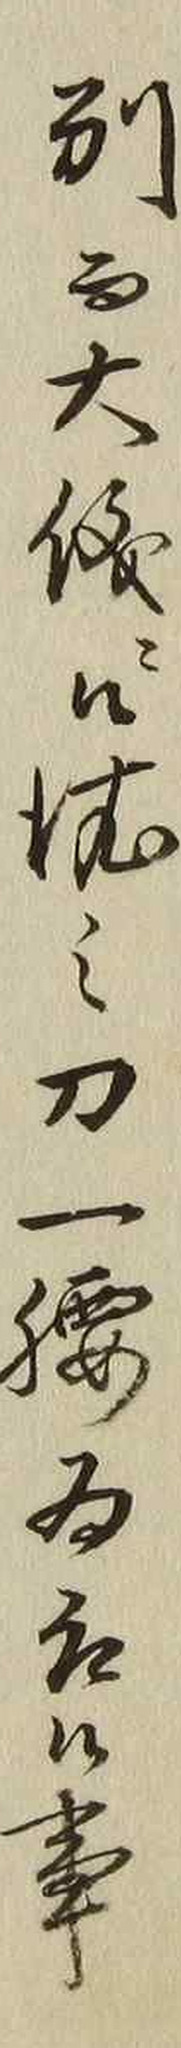別而大儀に候依之刀一腰為取候事
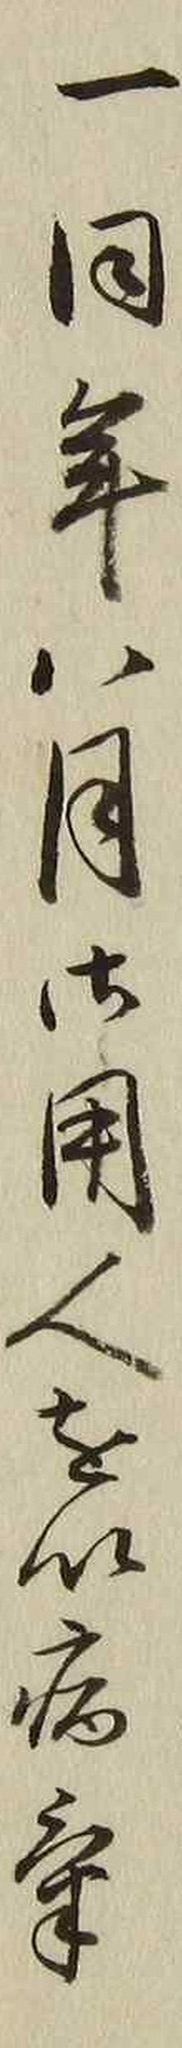一同年八月御用人を以病気
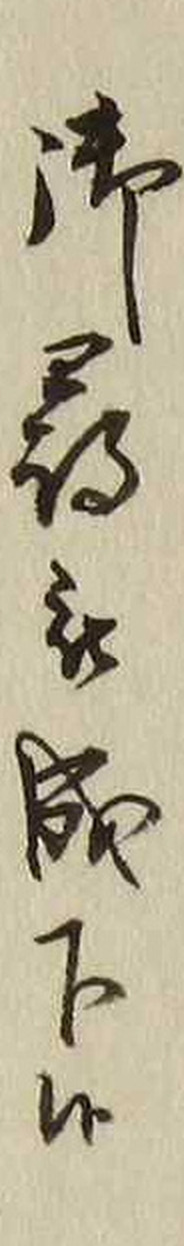御尋被成下候
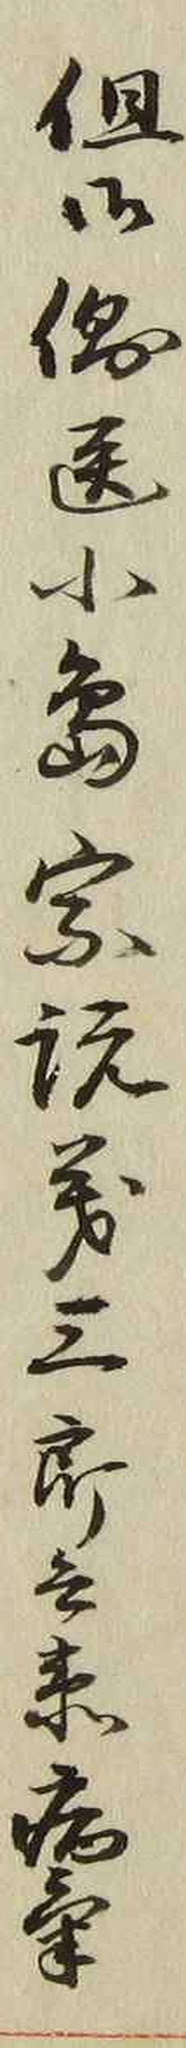但御側医小嶋宗悦義三郎兵衛病気
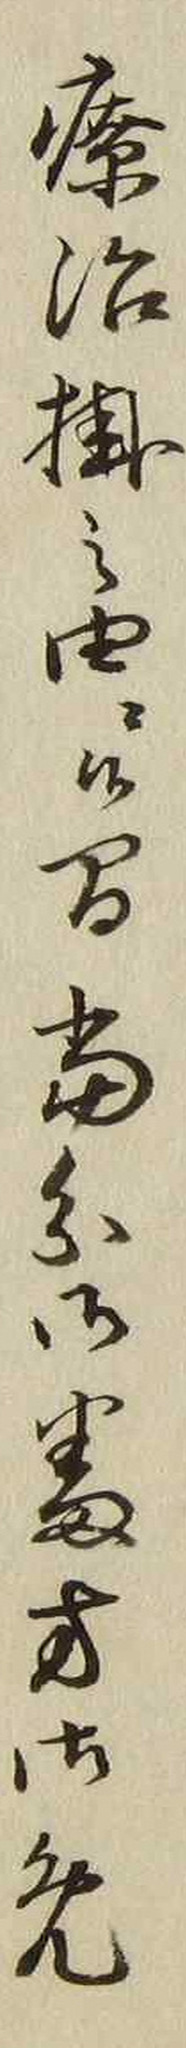療治掛之由に候間当分御番方御免
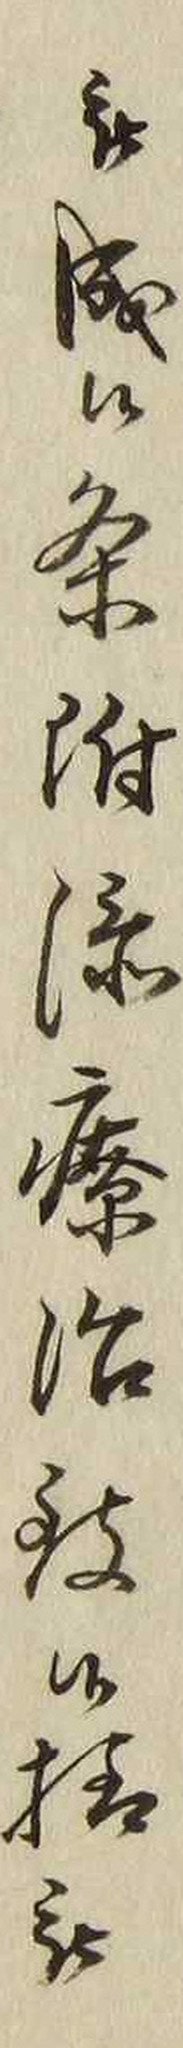被成候条附添療治致候様被
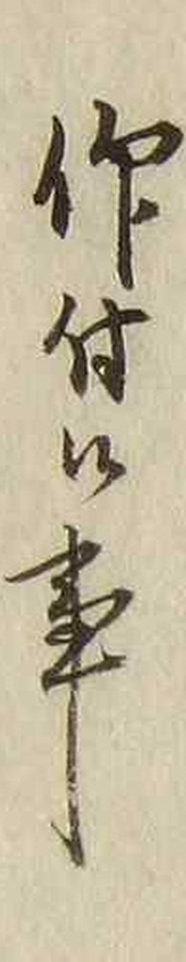仰付候事
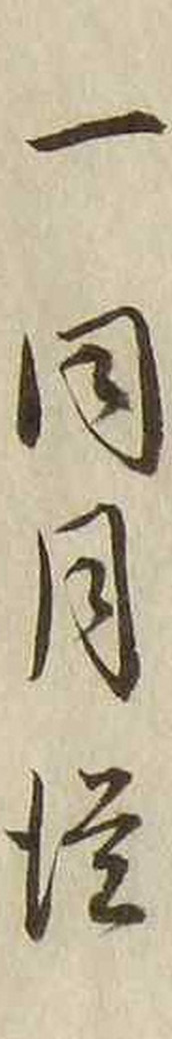一同月従

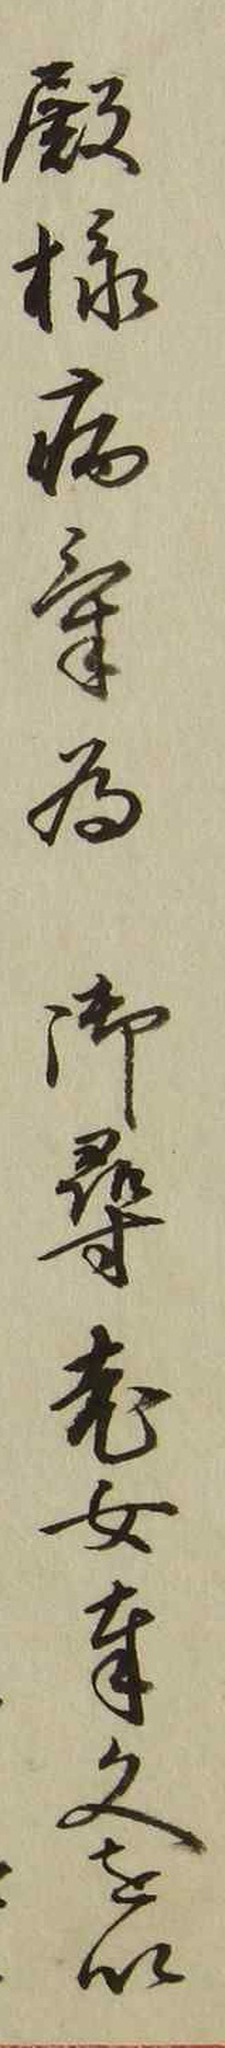殿様病気為御尋老女奉文を以
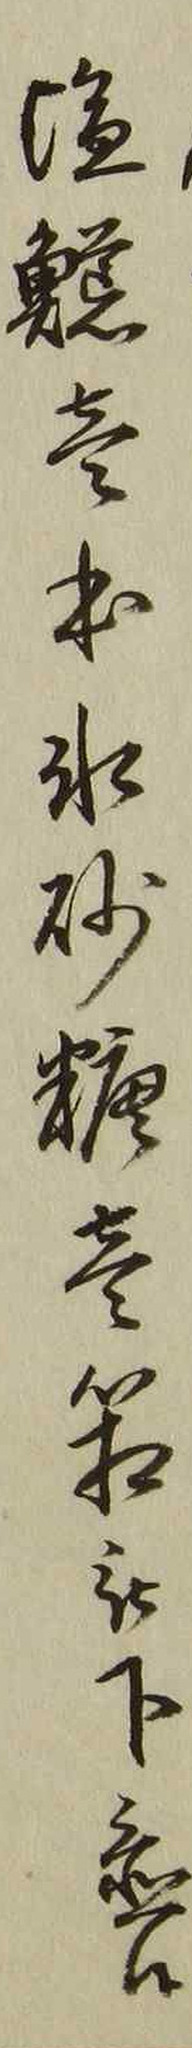塩壱本氷砂糖壱箱被下置候
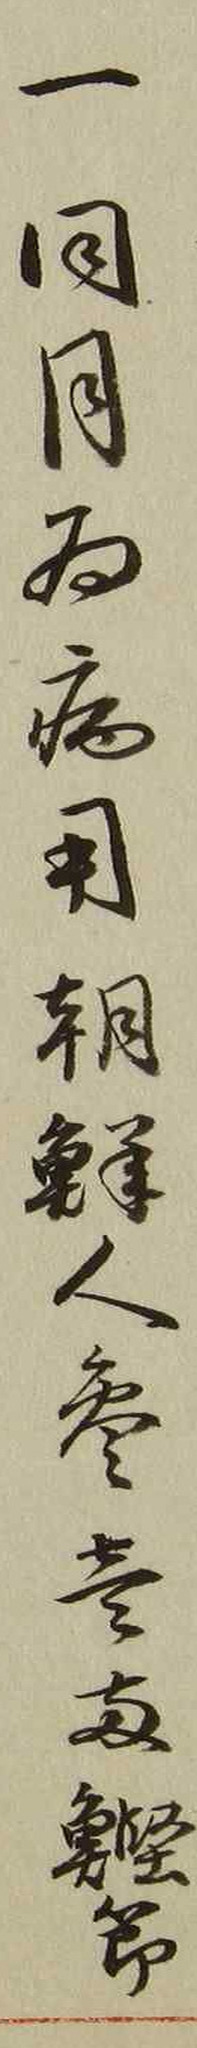一同月為病用朝鮮人参壱両鰹節
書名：諸士系譜　巻之125　た之部1
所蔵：会津若松市立会津図書館
